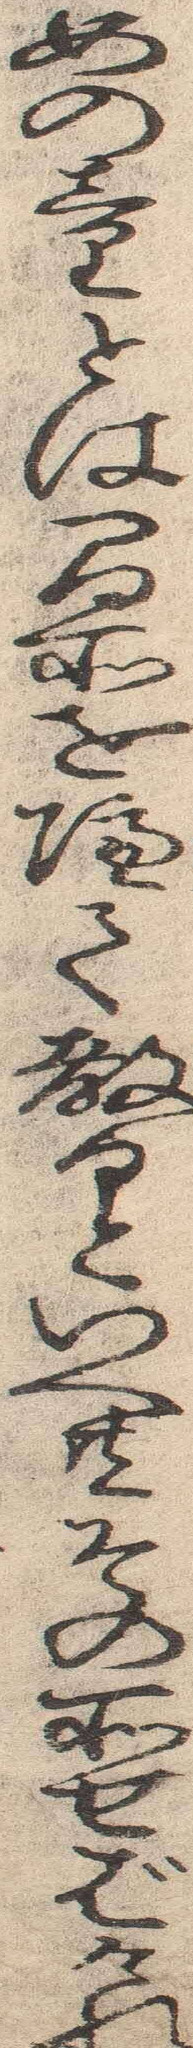女の童とは間所を隔て教るといへ共その所せばけれ
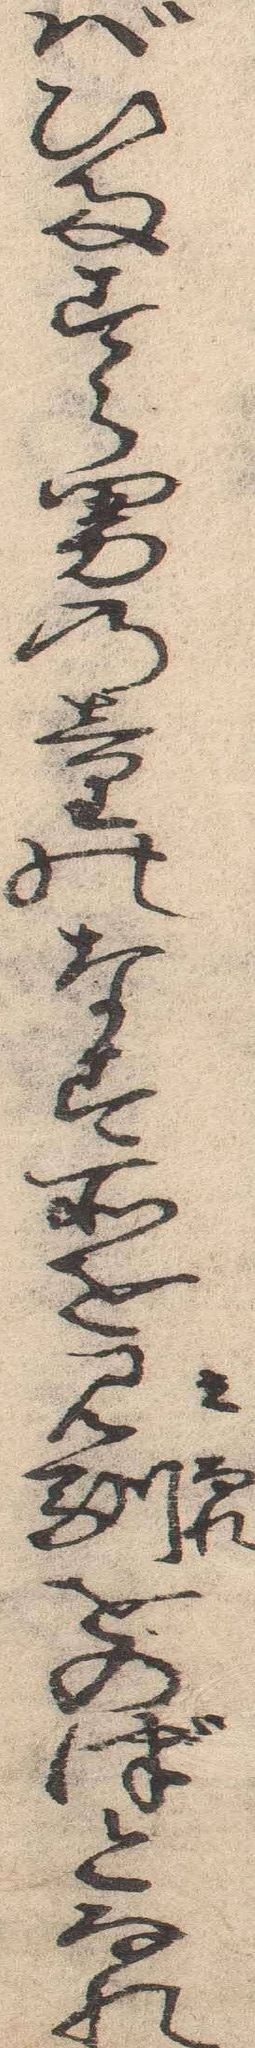ばひたすら男の童のなす所を見馴をのづとなれ

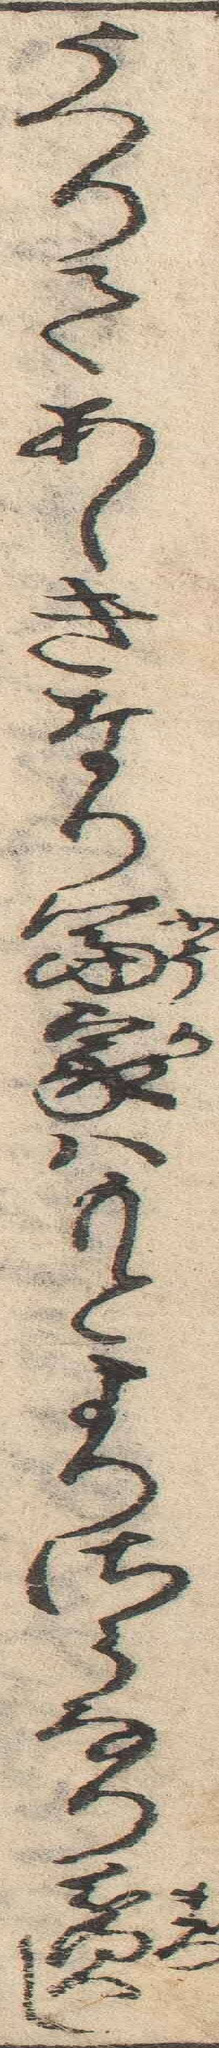うつりてあしきなり富家はもとよりさらなり貧し
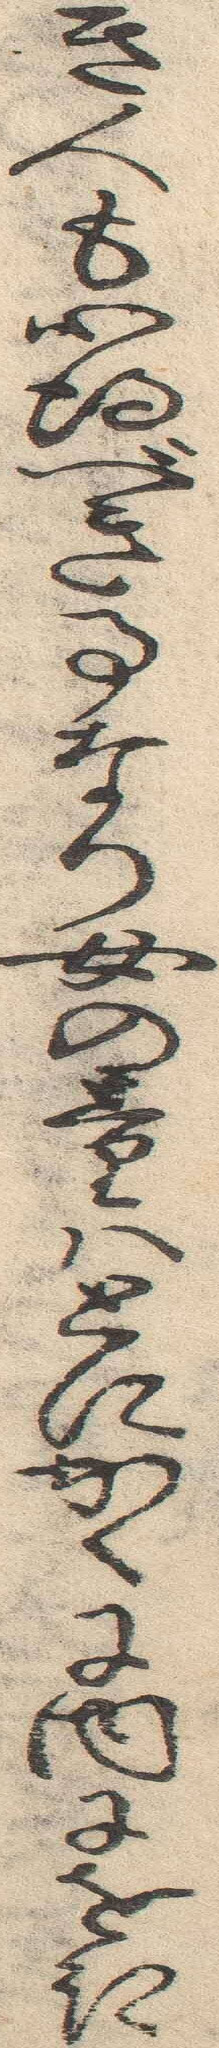き人も心得べき事なり女の童はとにかくに内にをき
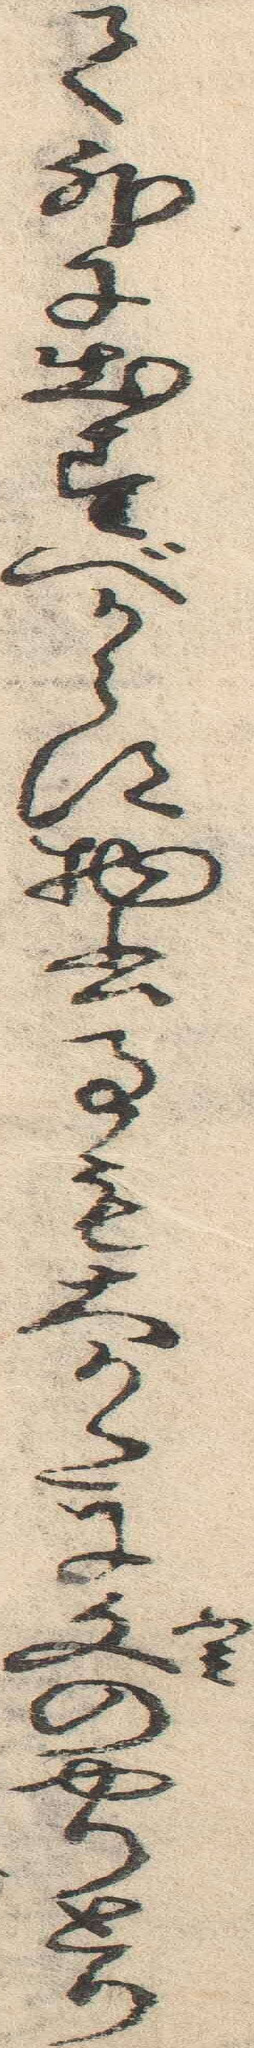て外に出すべからす物書事も大かたに文のやりとり
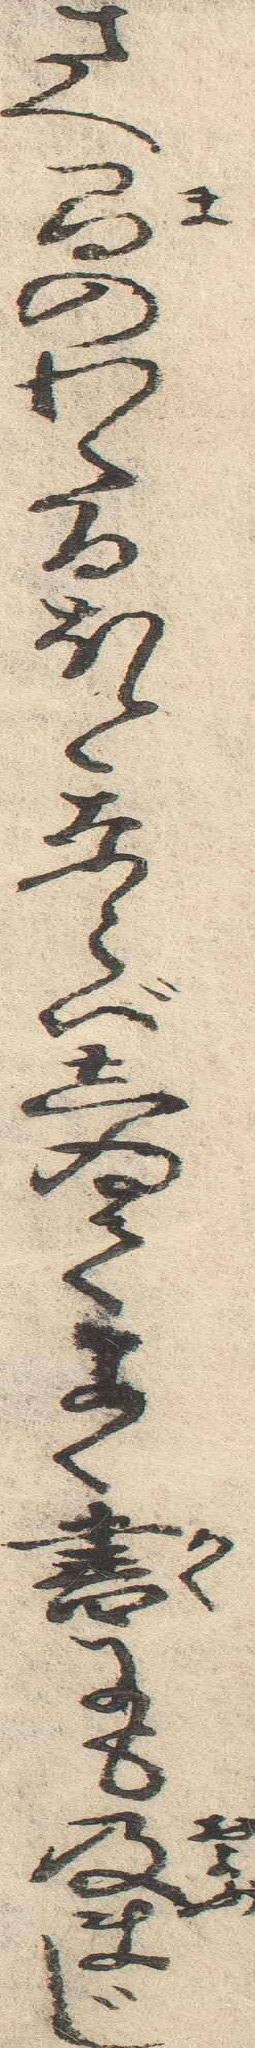さへ間のわたるほとならばしゐてよく書にも及まじ
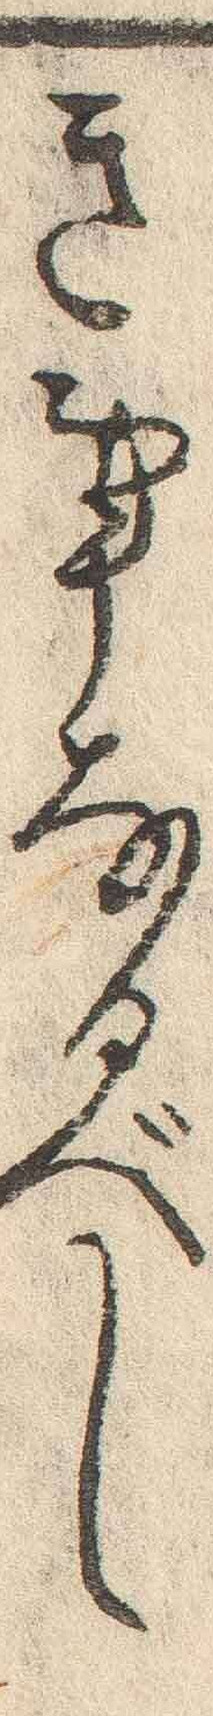き事なるべし
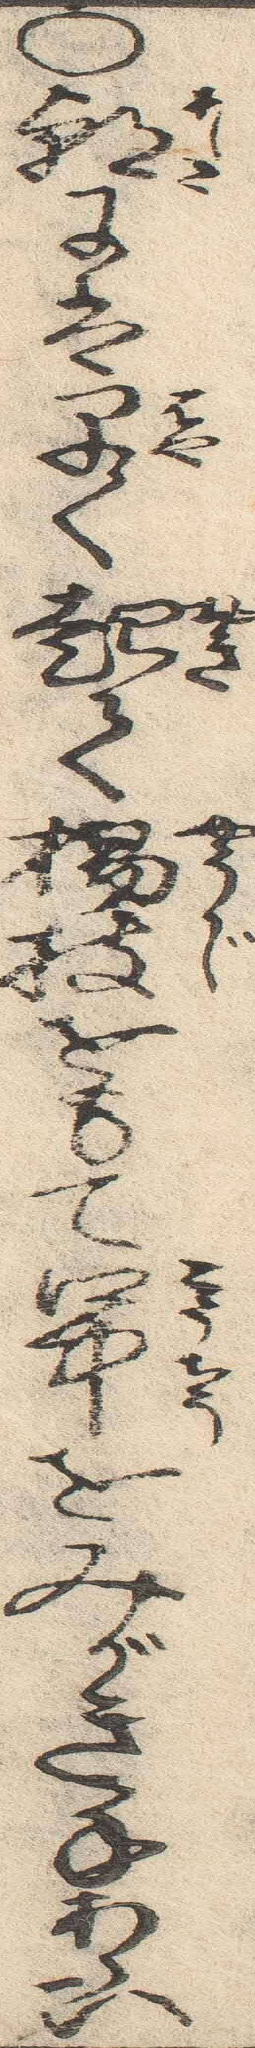○朝には早く起て楊枝をもて口中をみがき手あらひ
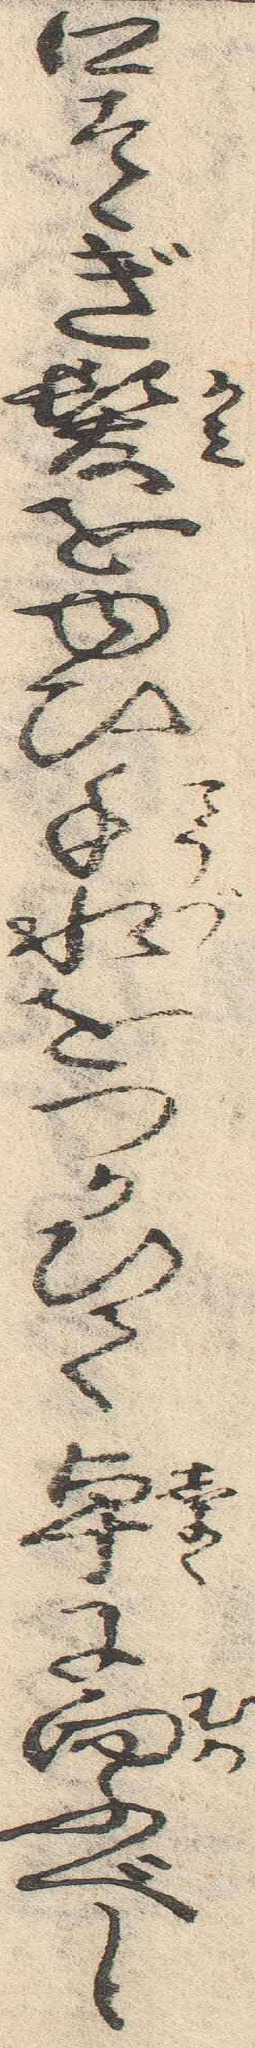口すゝぎ髪をゆひ手水をつかひて卓に向ふべし
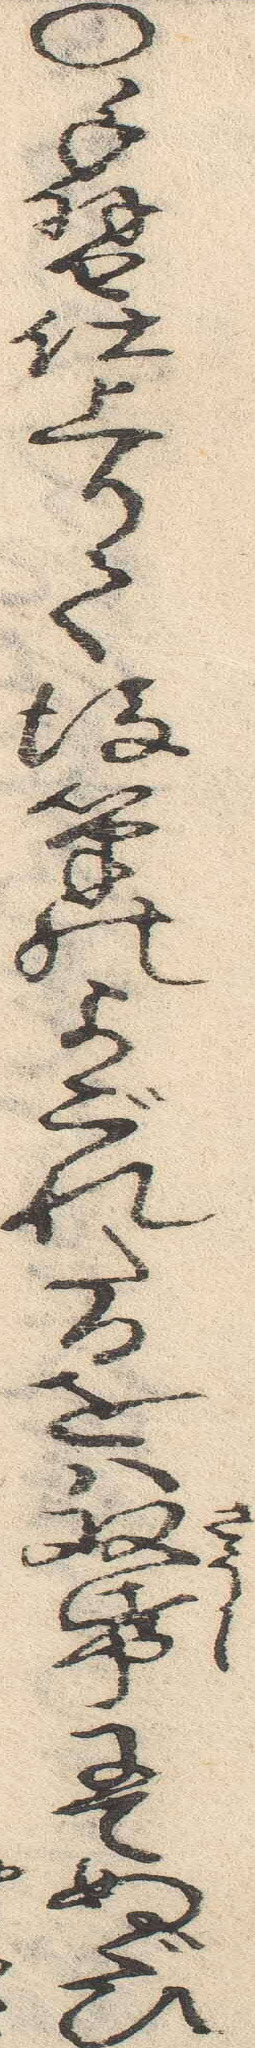○手習仕上りてのち筆のよごれたるをは双紙にてぬぐひ
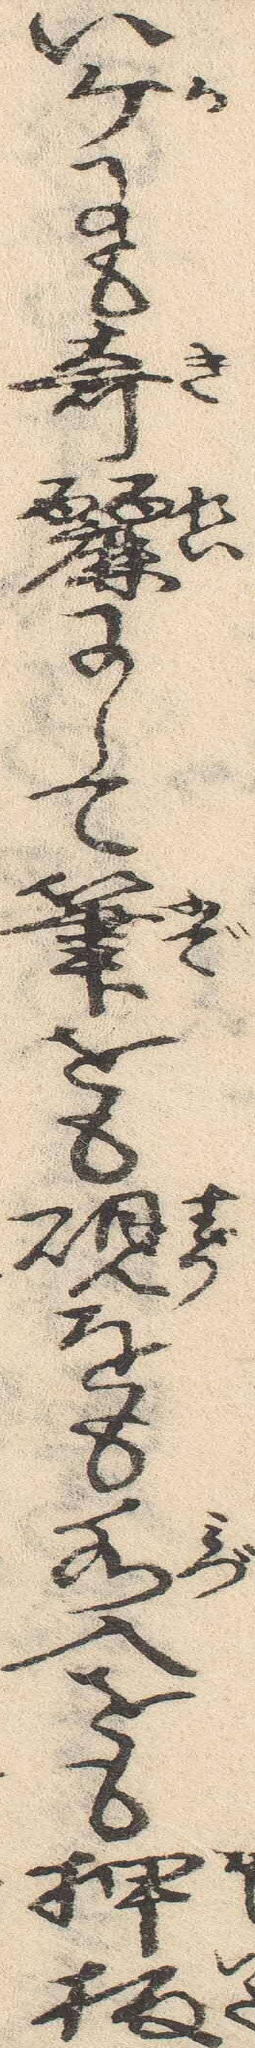いケにも奇麗にして筆をも硯をも水入をも押板
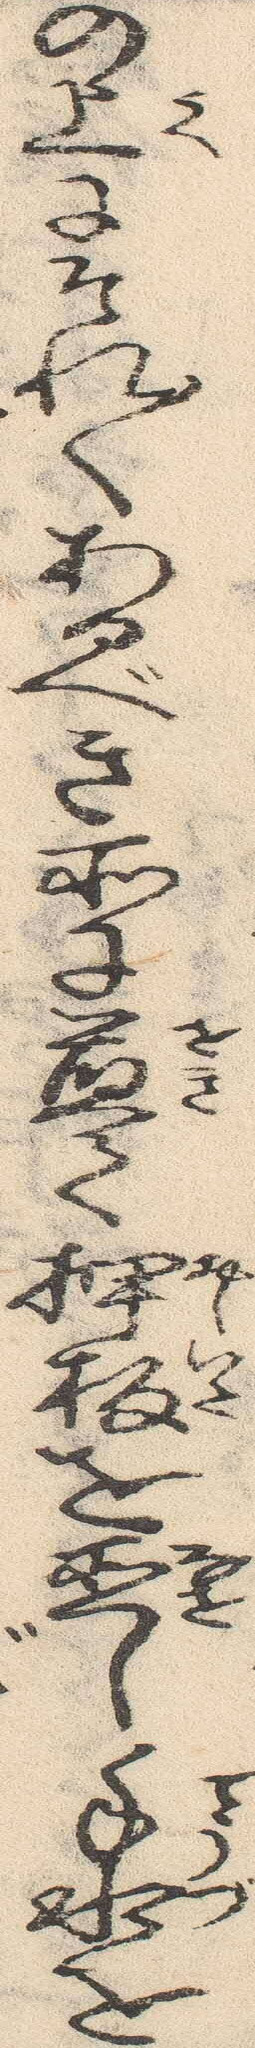の上にそれ〳〵あるべき所に置て押板を直し手水を
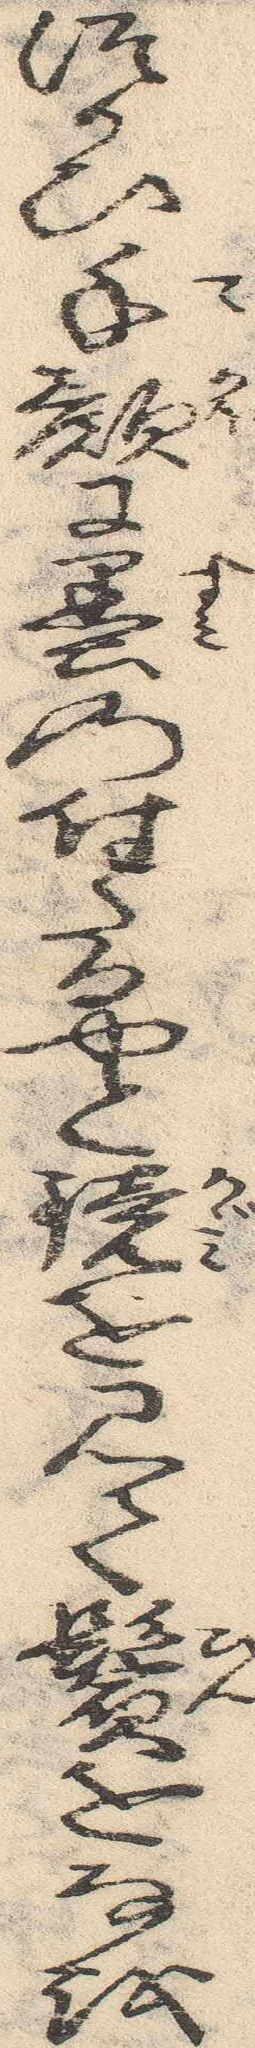つかひ手顔に墨の付たるやと鏡を見て鬢をなを
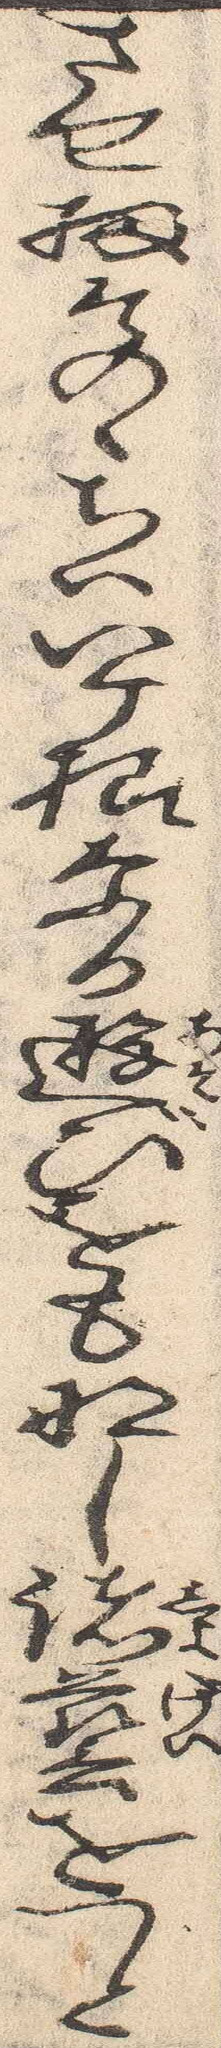させ扨そのゝちはいケ様なる遊びをもなし諸芸をつと
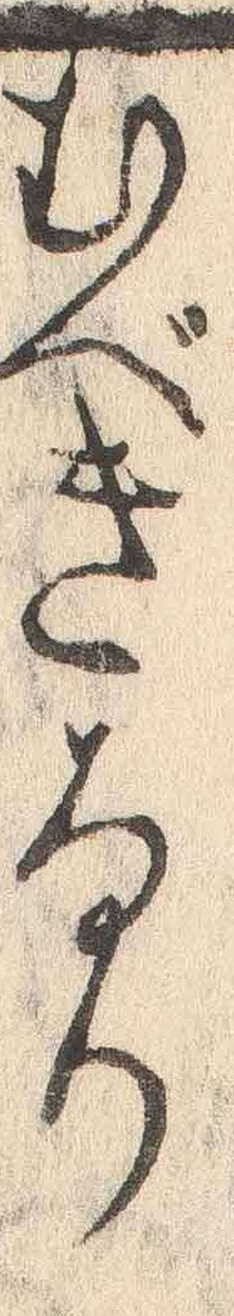むべきなり
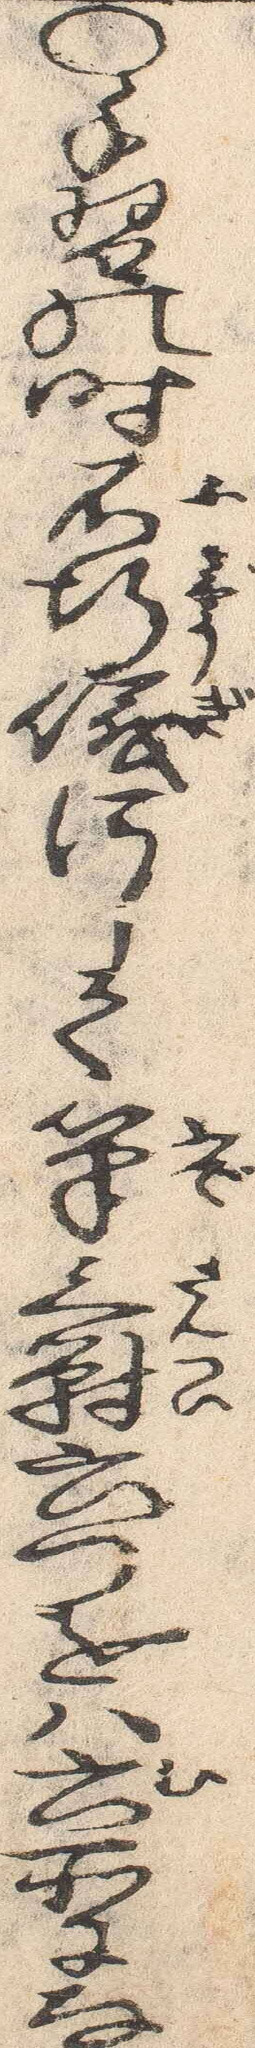○手習の時不行儀にして筆三対六つをは六所にな
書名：小児必用養育草
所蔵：東京学芸大学附属図書館 国文学研究資料館
